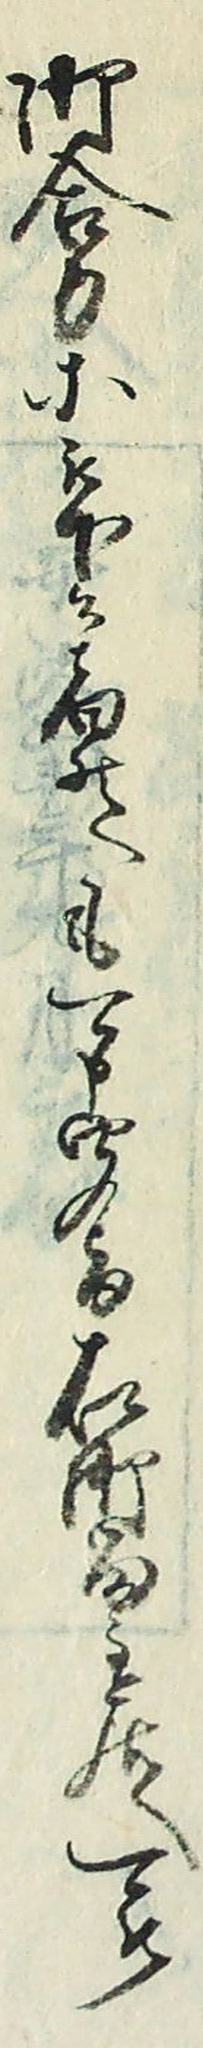御合力等被下候者共へも可申聞旨右御留主居へ可被
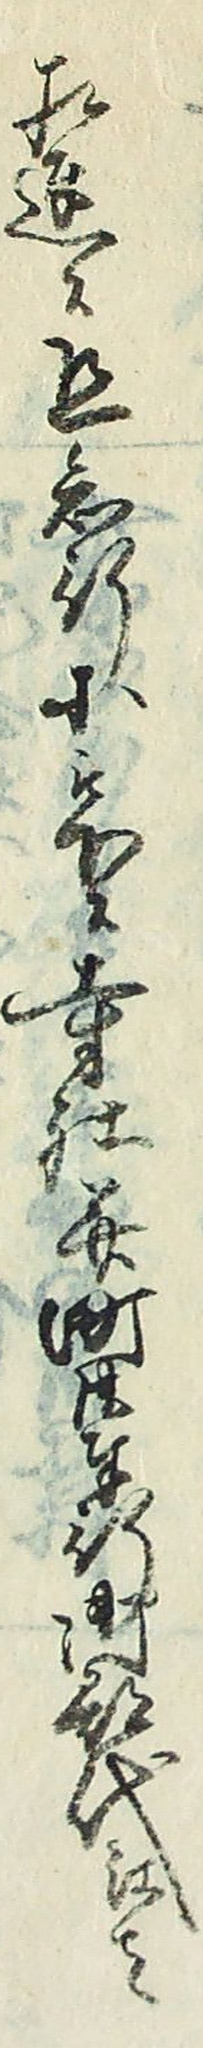相達候且知行等被下候寺社幷町御奉行御郡代江者
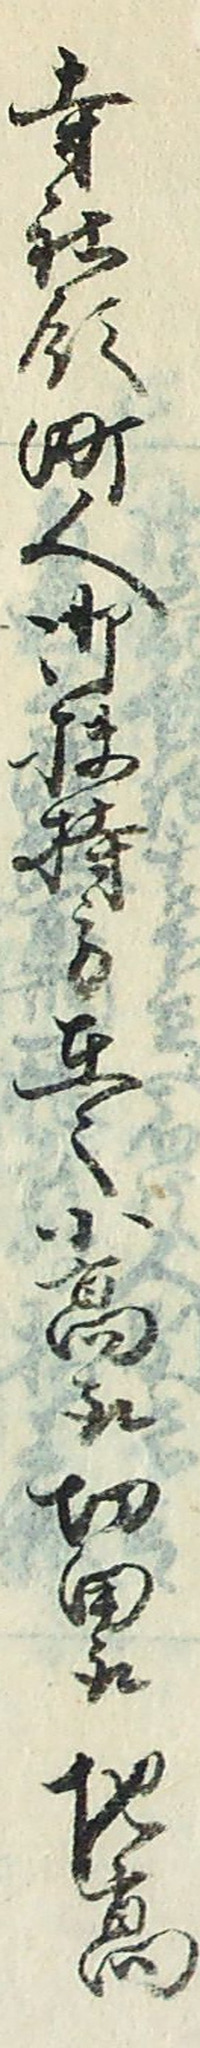寺社領町人御扶持方在々小高取切田取地高
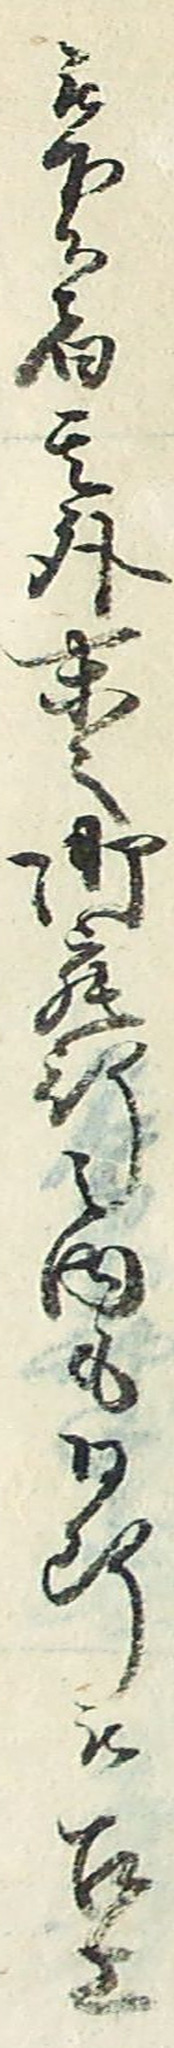被下候者其外末々御宛行之内も同断被召上

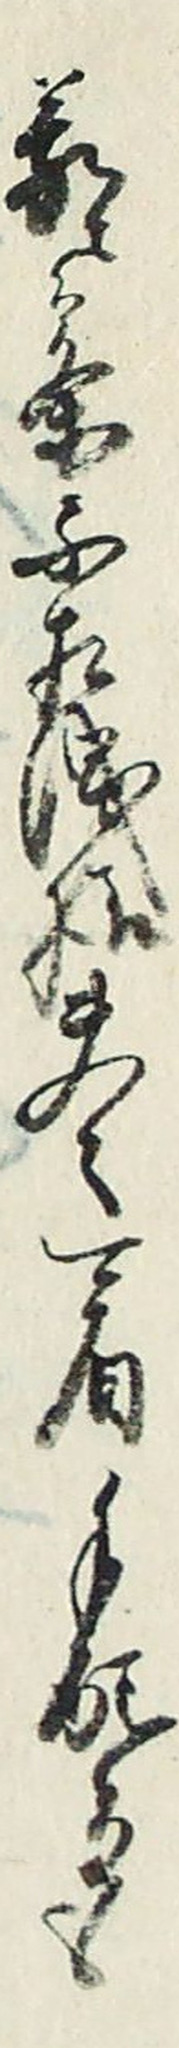義ニ候条不相洩様夫々可有手配候以上
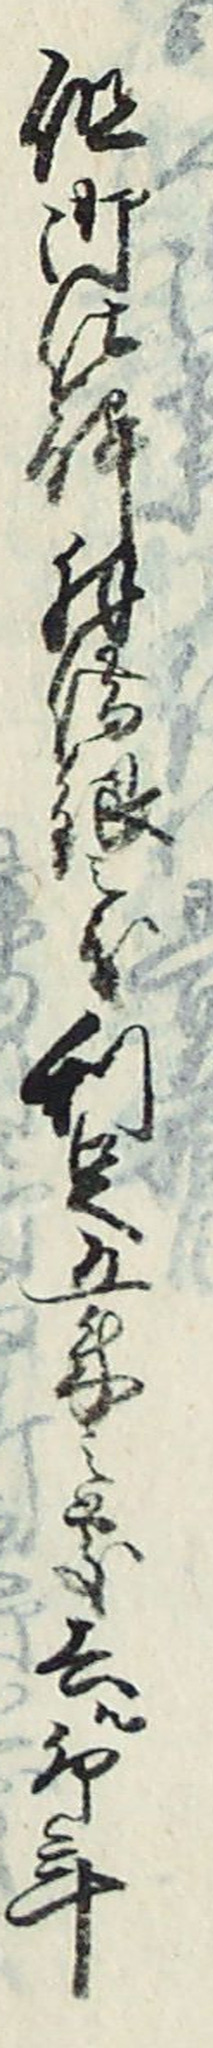但御仕解拝料銀之義利足五朱之處去ル卯年
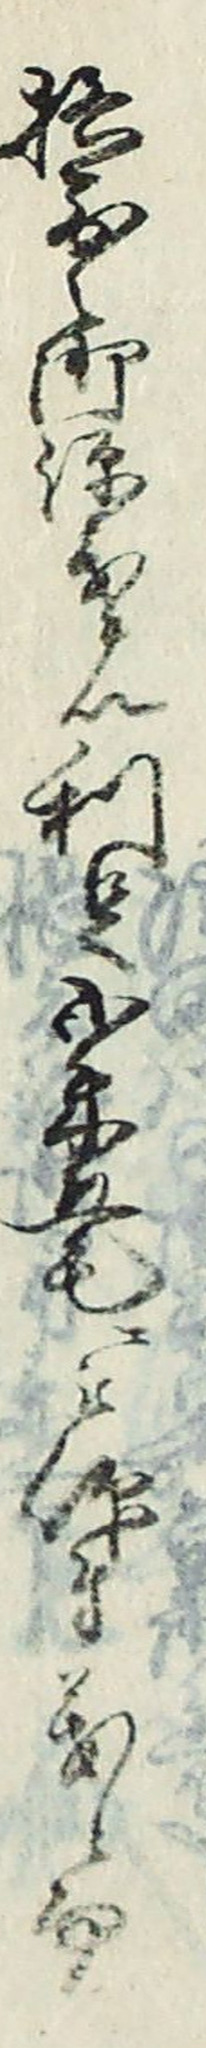格別之御評義を以利足弐朱五毛ニ被仰付義ニ而
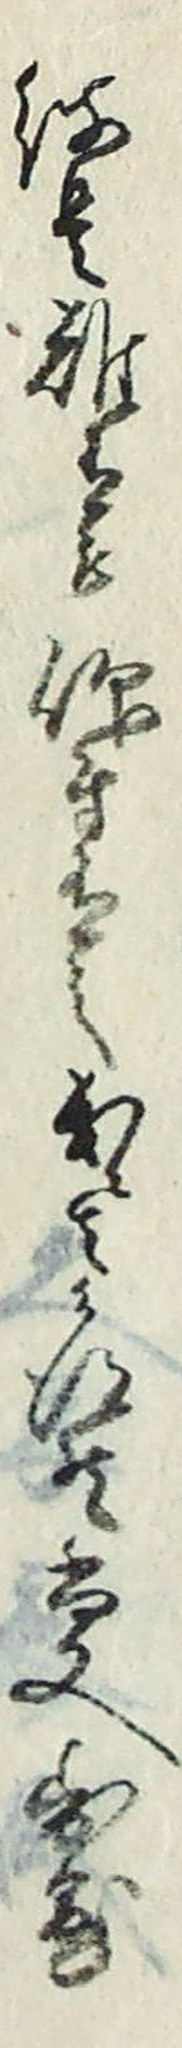彼是難有被仰付有之義ニ者候得共尚又歩懸
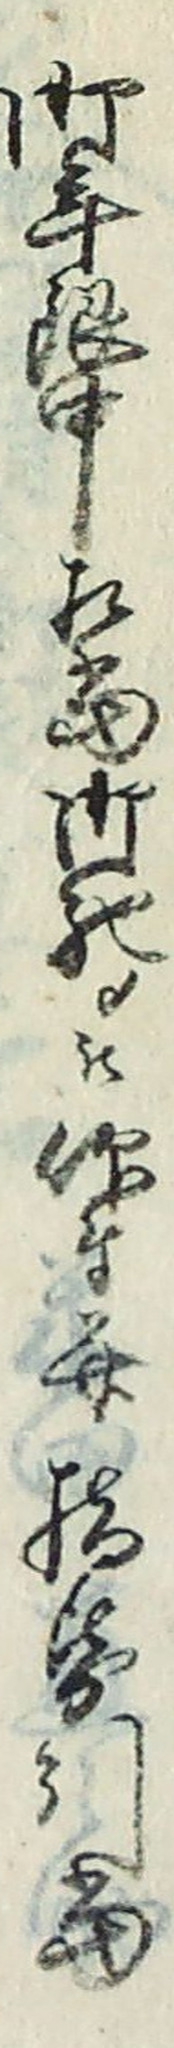御年限中相當御弛メ被仰付幷指替引當
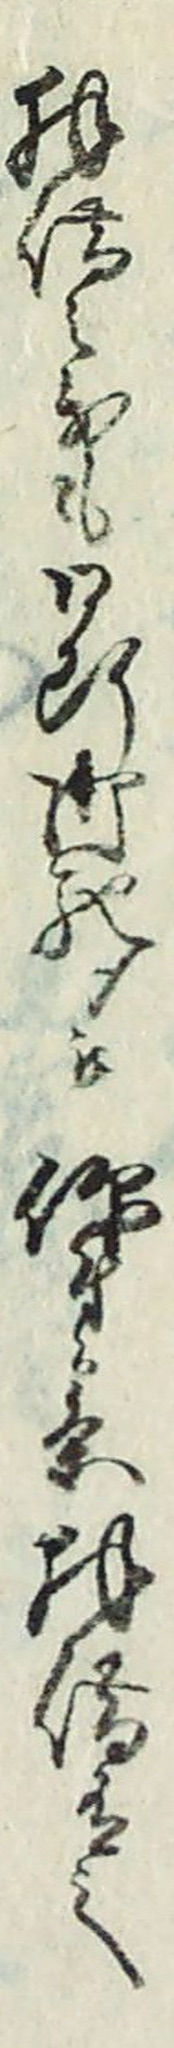拝借之義も同断御弛メ被仰付候条拝借有之
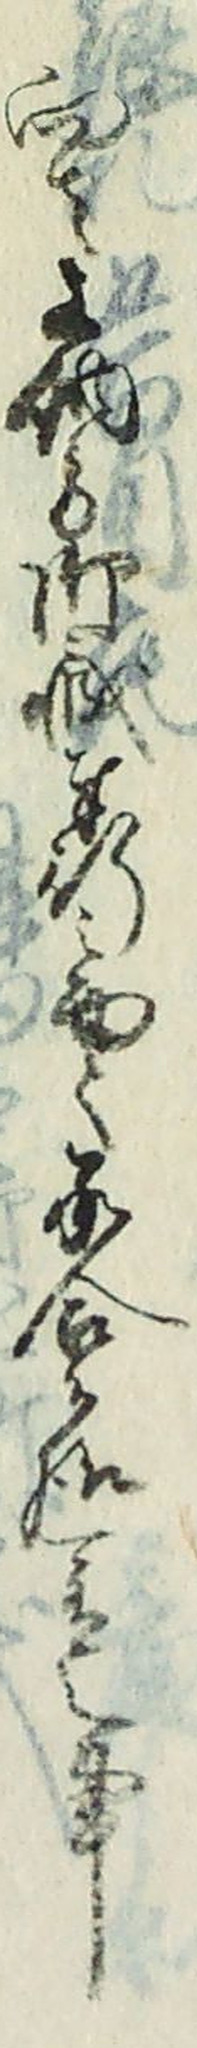向者上納方御蔵奉行之面々承合候様可有之事
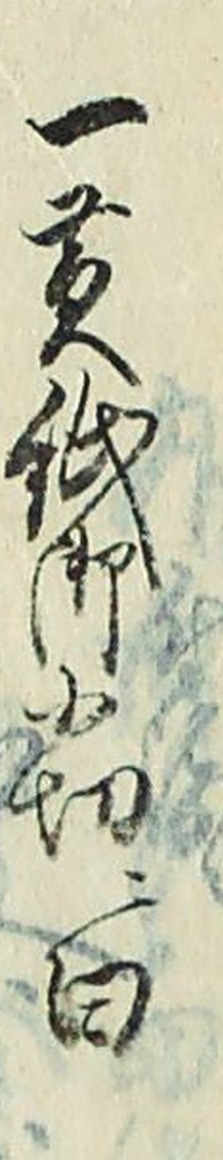一黄紙御小切ニ曰
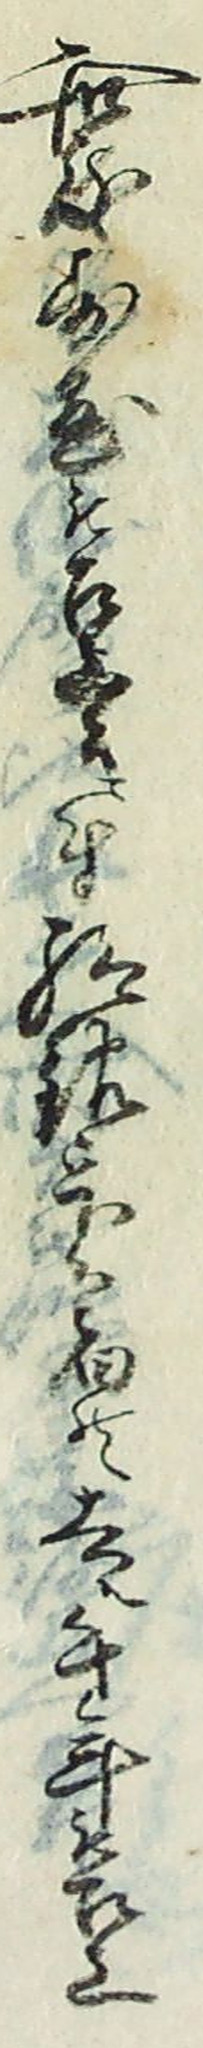此度歩懸被召上候ニ付給銀被下候者共去ル午年被召上
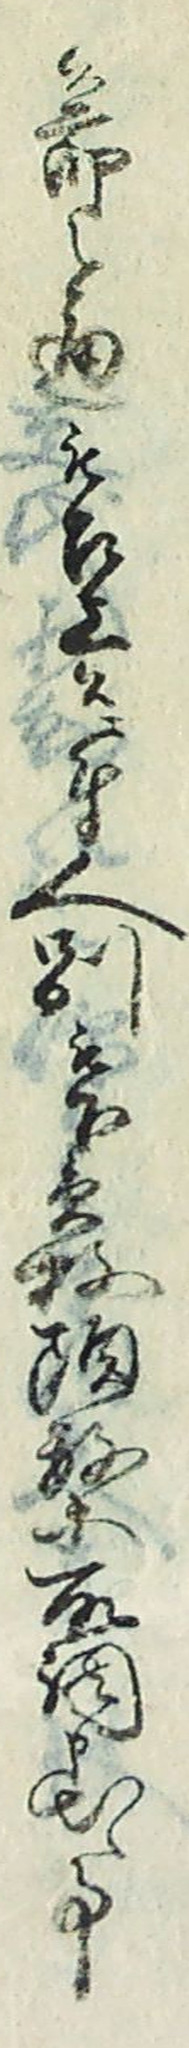候節之通被召上候ニ付人別被下員数頭数等取調申出候事
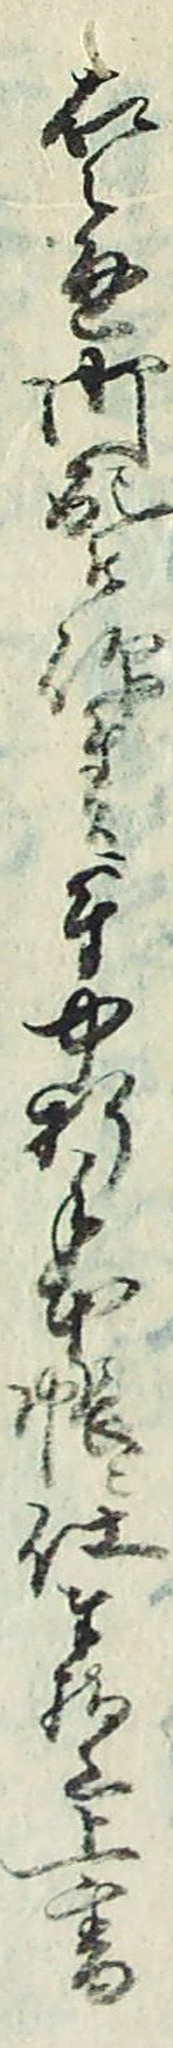右之通御配被仰付候ニ付中折手本帳ニ仕奉指上書
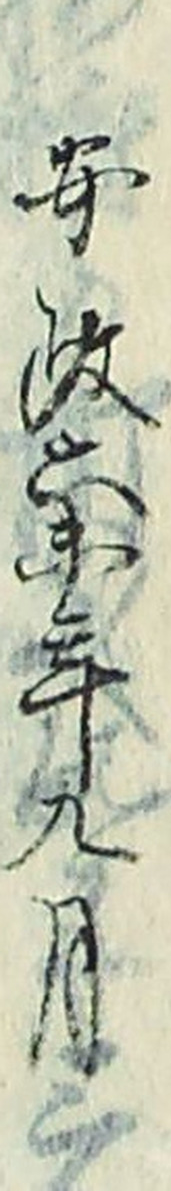安政六未年九月
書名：諸御趣意書并御下知向之写
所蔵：鳴門教育大学 Naruto University of Education
